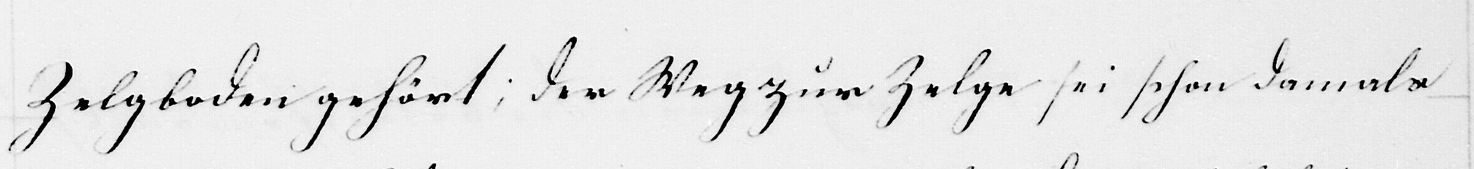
Zelgboden gehört; der Weg zur Zelge sei schon damals
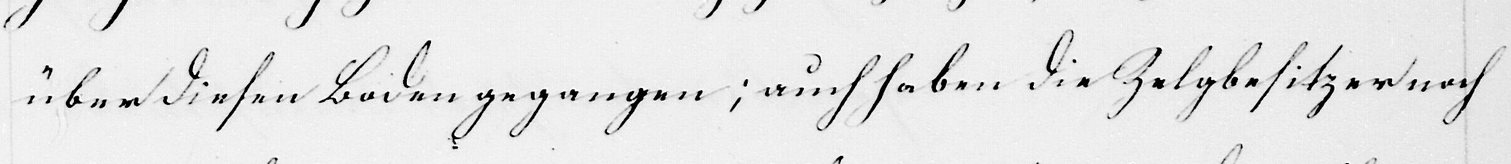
über diesen Boden gegangen; auch haben die Zelgbesitzer noch
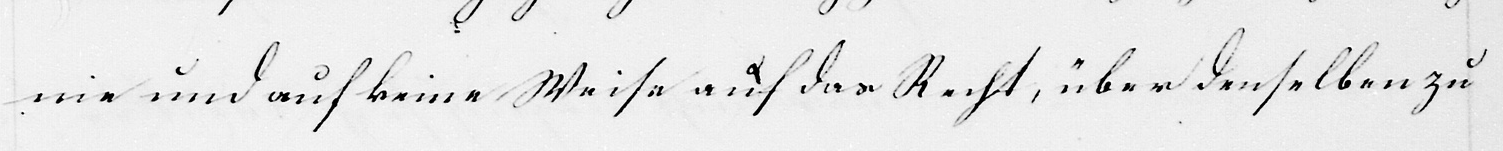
nie und auf keine Weise auf das Recht, über denselben zu
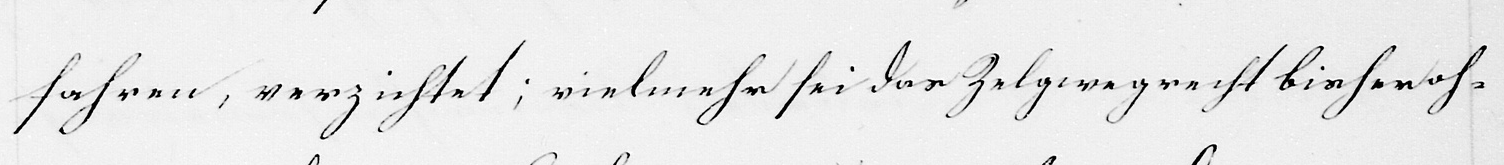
fahren, verzichtet; vielmehr sei das Zelgwegrecht bisher oh¬
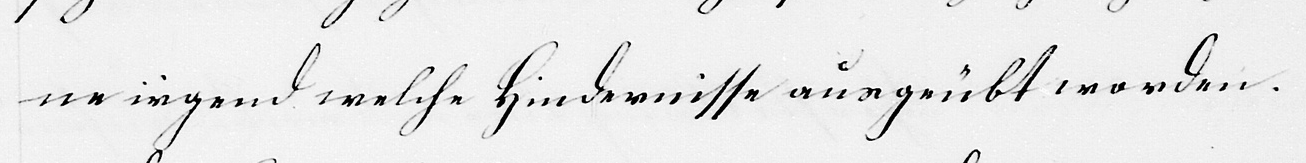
ne irgend welche Hindernisse ausgeübt worden.
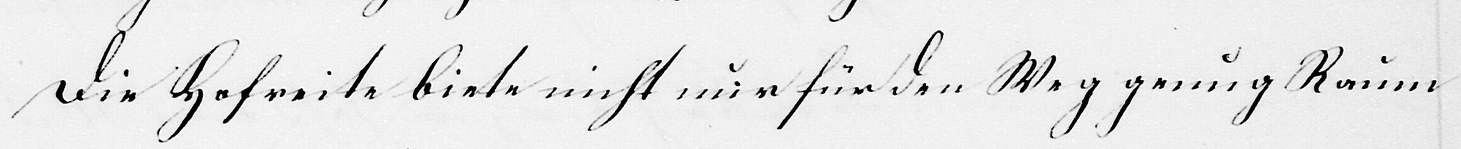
Die Hofreite biete nicht nur für den Weg genug Raum
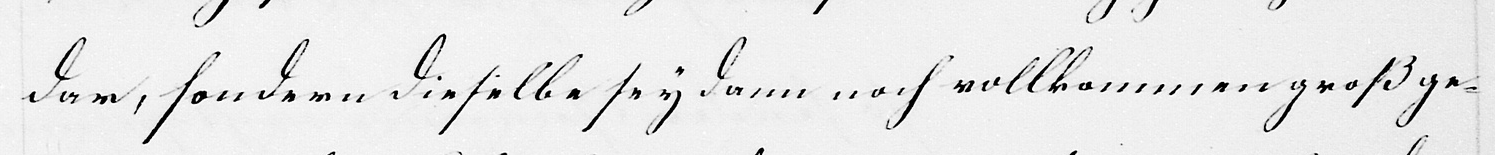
dar, sondern dieselbe sey dann noch vollkommen groß ge¬
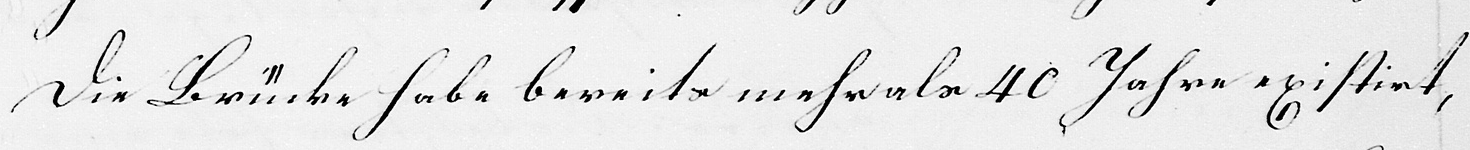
Die Brücke habe bereits mehr als 40 Jahre existirt,
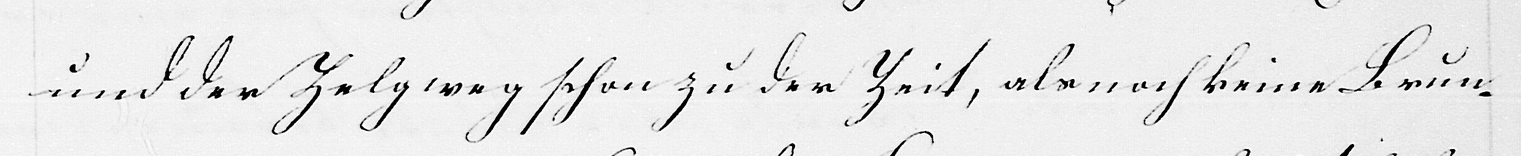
und der Zelgweg schon zu der Zeit, als noch keine Brun¬
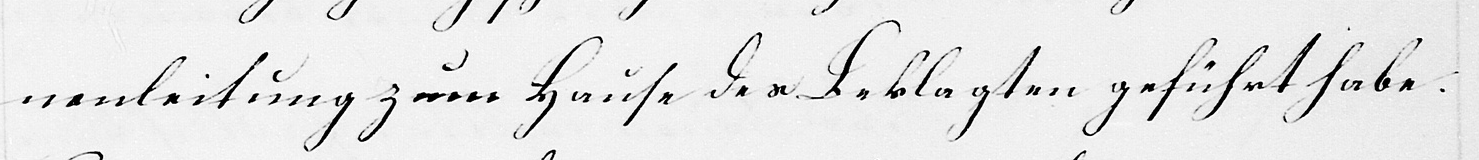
nenleitung zum Hause des Beklagten geführt habe.
